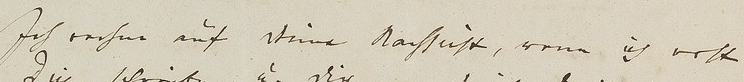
Ich rechne auf deine Nachricht, wenn ich erst
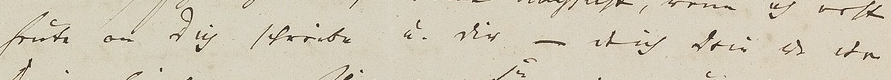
heute an Dich schreibe u. dir – da ich Deine u. der
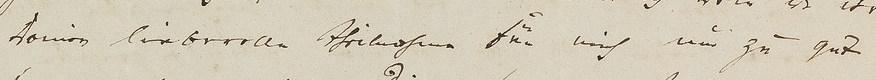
Deinen liebevolle Theilnahme für mich nur zu gut
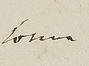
kenne
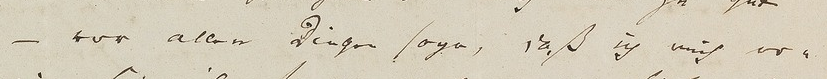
– vor allen Dingen sogar, daß ich mich er-
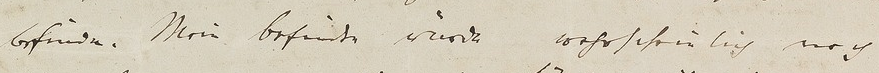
befinde. Mein Befinden würde wahrscheinlich noch
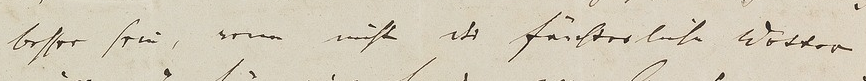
besser sein, wenn nicht das fürchterliche Wetter
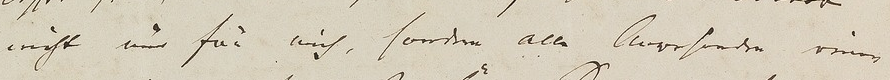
nicht nur für mich, sondern alle Anwesenden einen
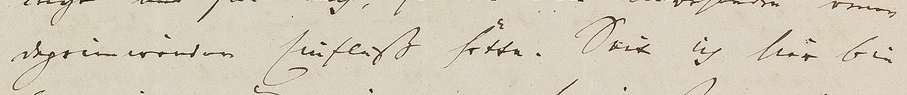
deprimierenden Einfluß hätte. Seit ich hier bin
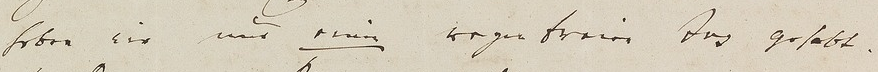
haben wir nur einen regenfreien Tag gehabt.
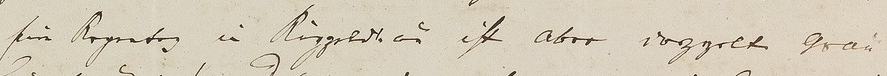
Ein Regentag in Rippoldsau ist aber doppelt Grau
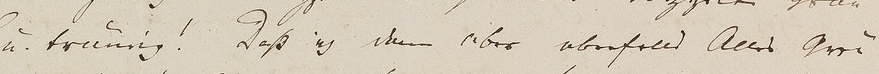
u. traurig! Daß ich dann aber ebenfalls Alles Grau
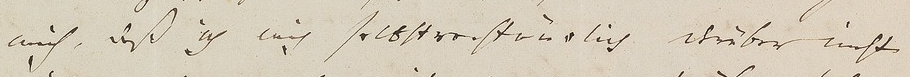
mich, daß ich mich selbstverständlich darüber nicht
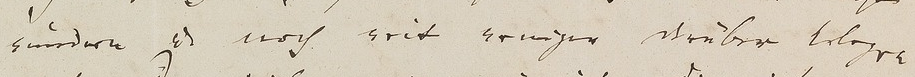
wundere u. noch weit weniger darüber klagen
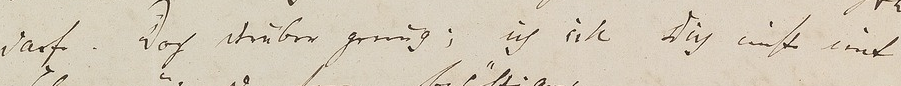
darf. Doch darüber genug; ich will Dich nicht mit
